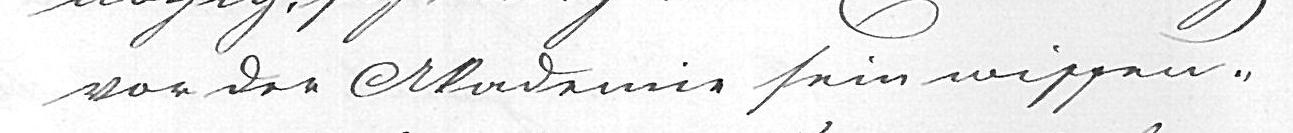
vor der Akademie sein wissen-
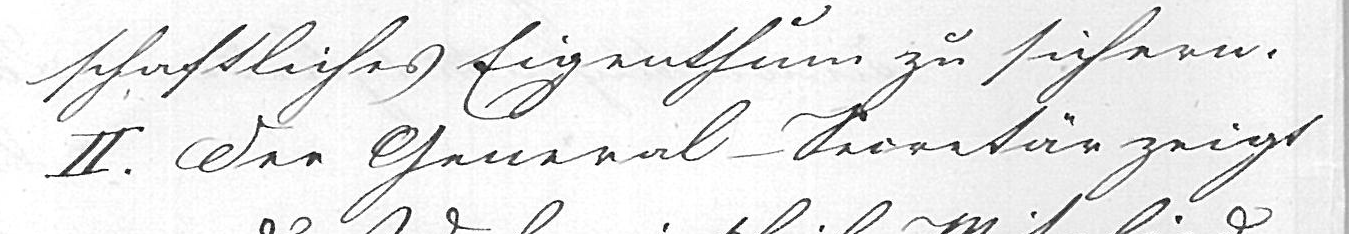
schaftliches Eigenthum zu sichern.
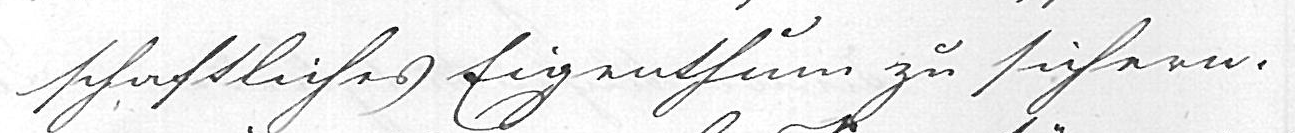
II. Der General-Secretär zeigt
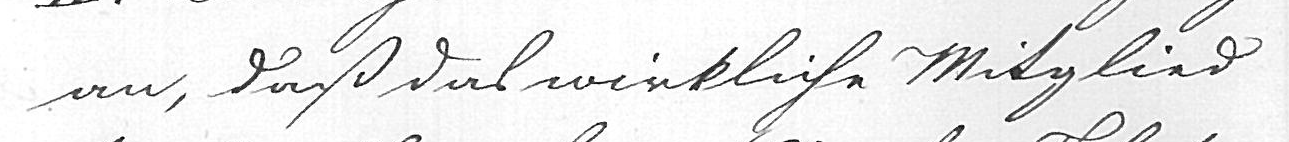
an, daß das wirkliche Mitglied
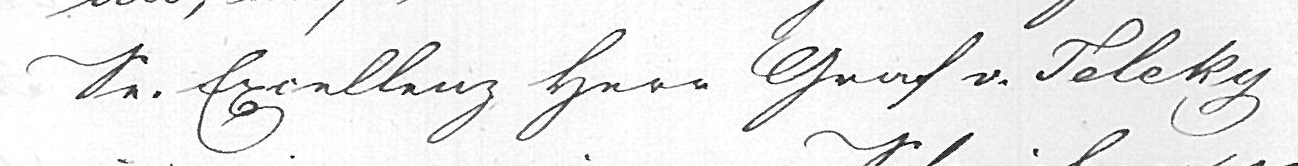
Sr. Excellenz Herr Graf v. Teleky
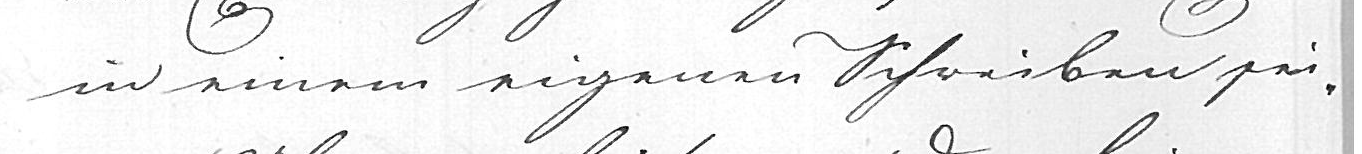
in einem eigenen Schreiben sei-
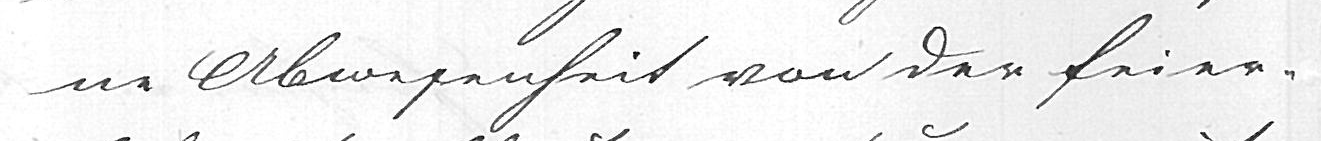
ne Abwesenheit von der feier-
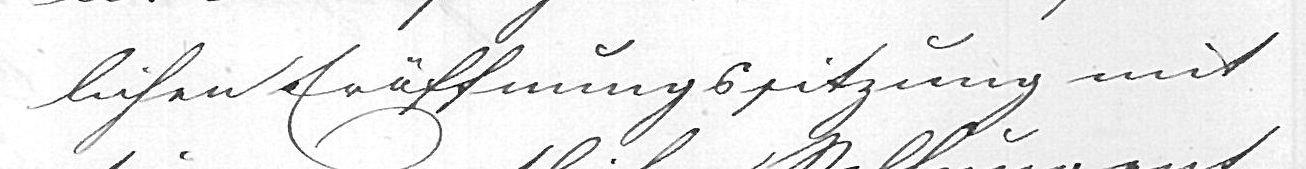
lichen Eröffnungssitzung mit
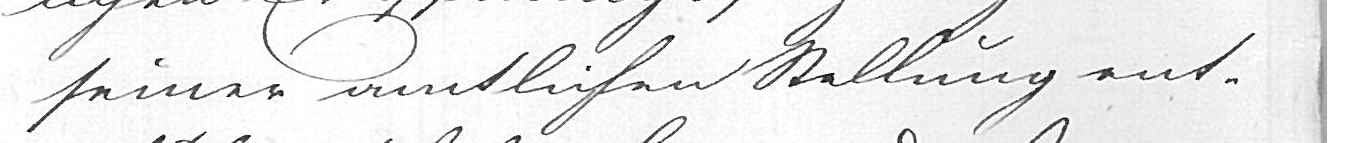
seiner amtlichen Stellung ent-
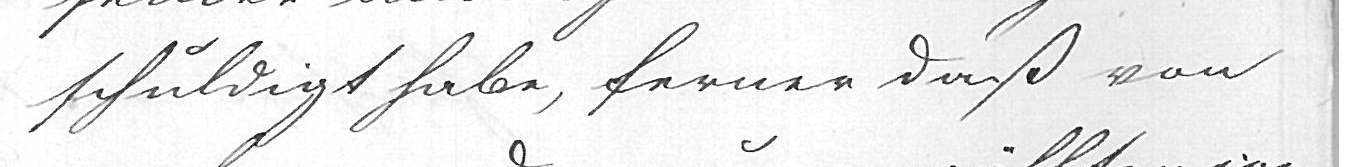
schuldigt habe, ferner daß von
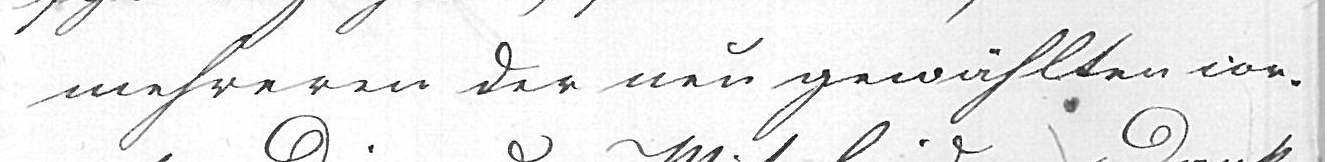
mehreren der neu gewählten cor-
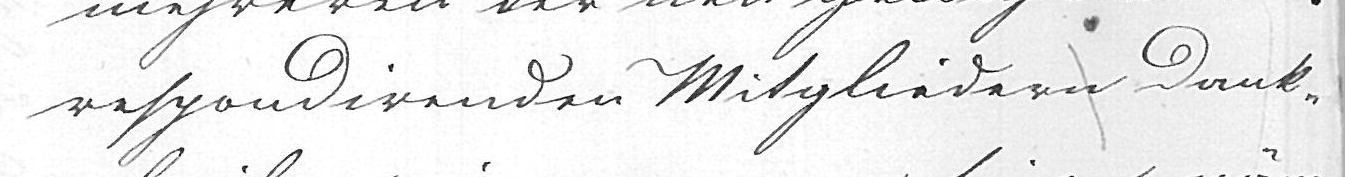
respondirenden Mitgliedern Dank-
